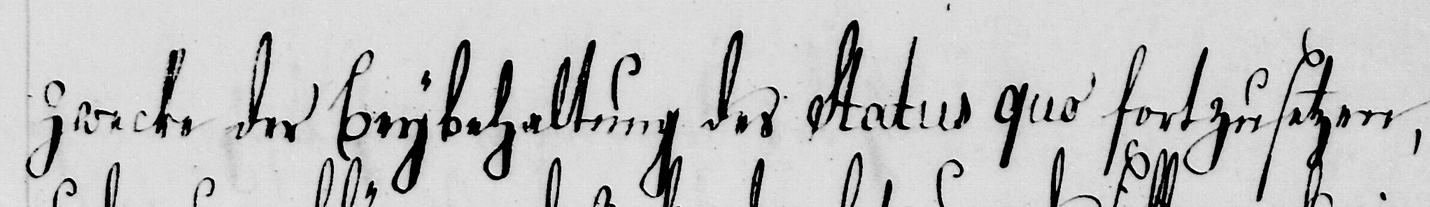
Zwecke der Beybehaltung des Status quo fortzusetzen,
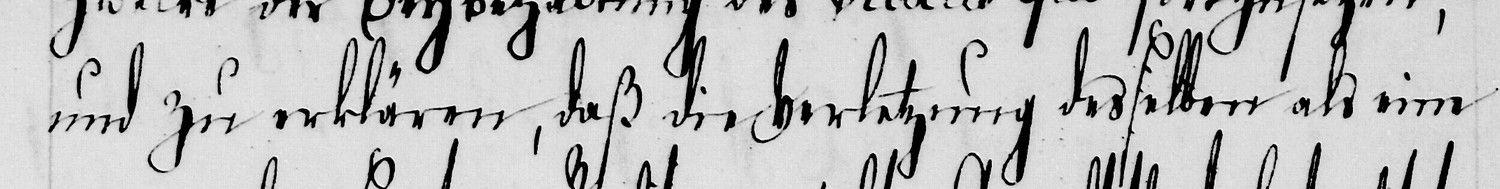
und zu erklären, daß die Verletzung desselben als eine
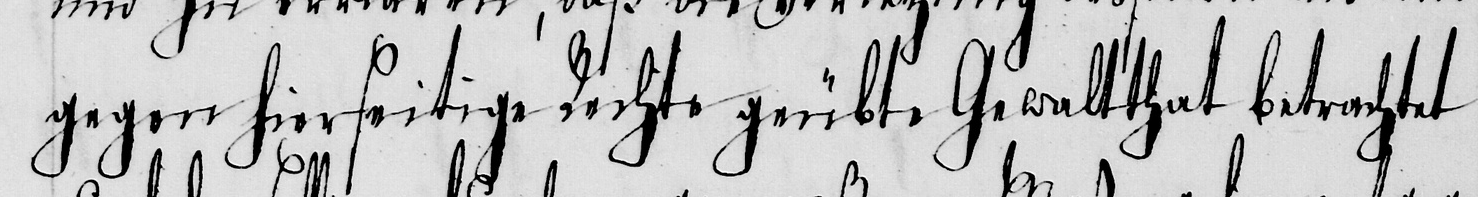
gegen hierseitige Rechte geübte Gewaltthat betrachtet
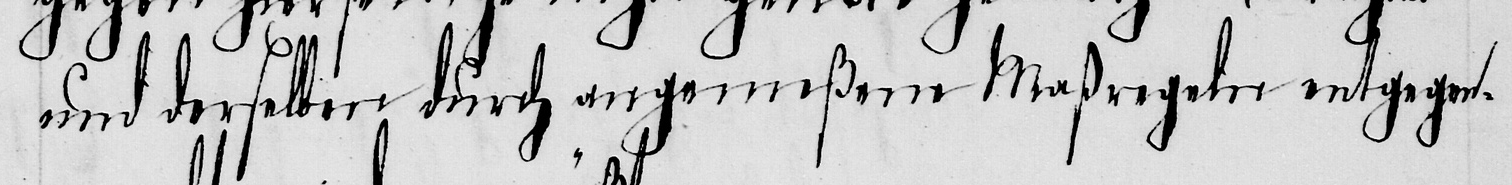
und derselben durch angemeßene Maßregeln entgegen¬
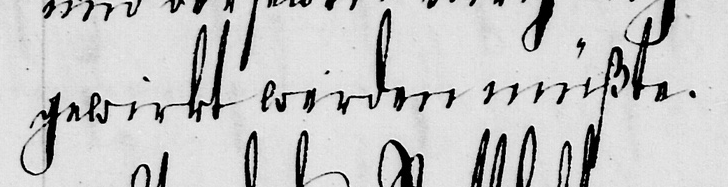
gewirkt werden müßte.
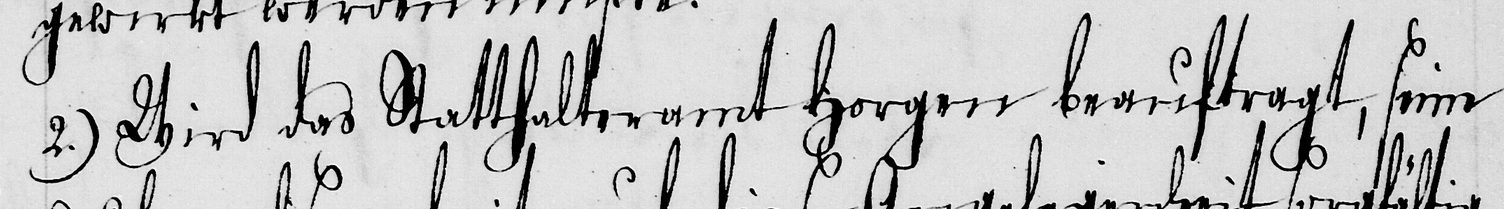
2.) Wird das Statthalteramt Horgen beauftragt, seine
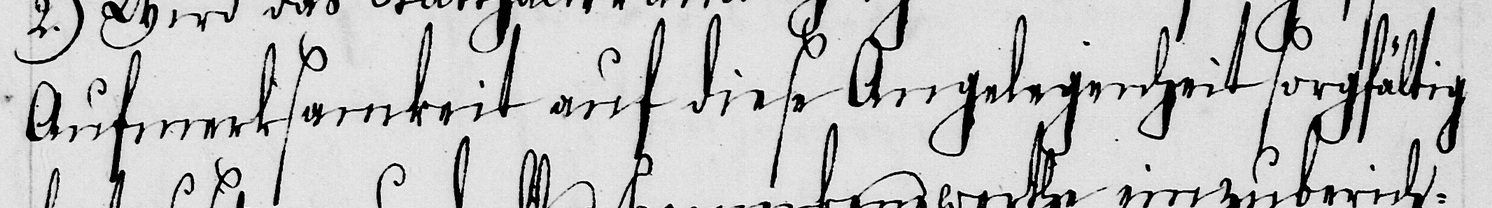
Aufmerksamkeit auf diese Angelegenheit sorgfältig
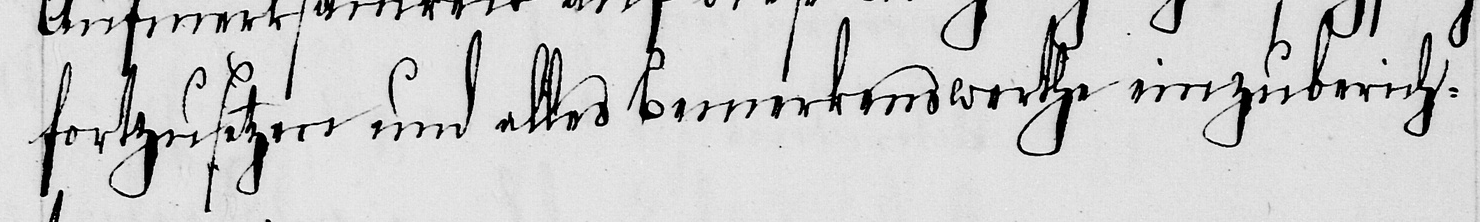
fortzusetzen und alles Bemerkenswerthe einzuberich¬
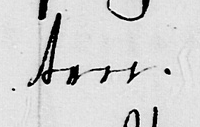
ten.
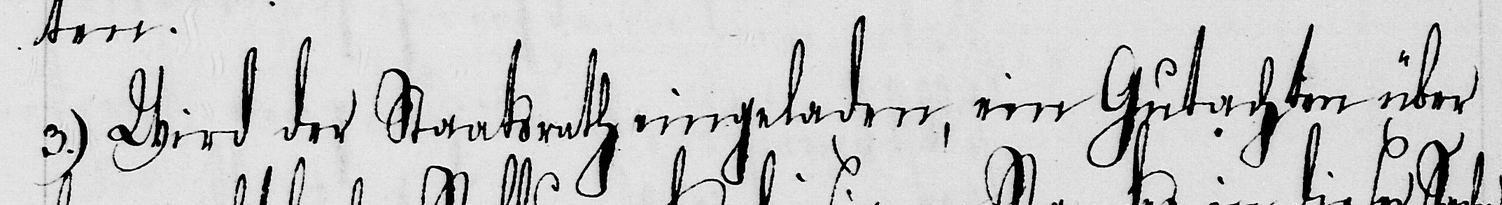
3.) Wird der Staatsrath eingeladen, ein Gutachten über
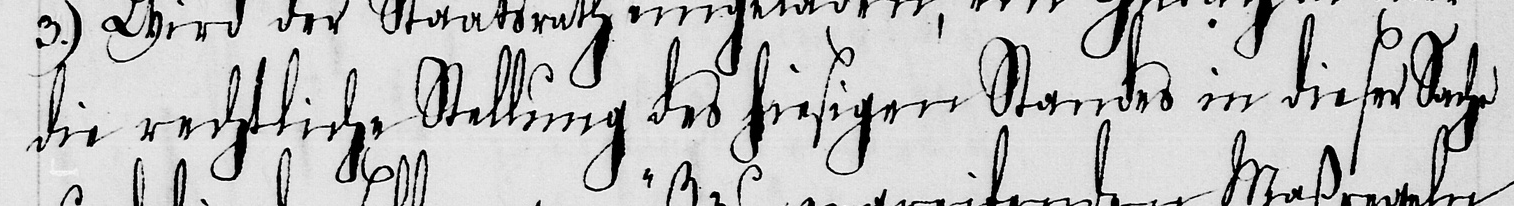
die rechtliche Stellung des hiesigen Standes in dieser Sac¬
